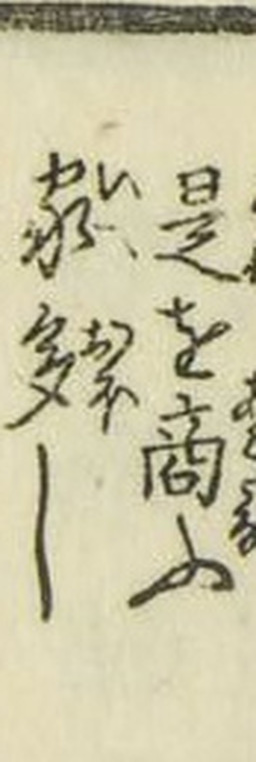家多し
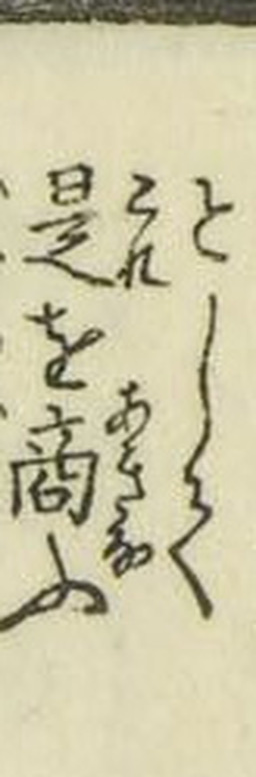是を商ふ
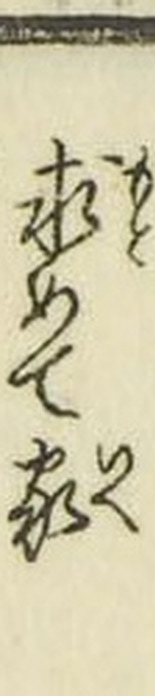求めて家
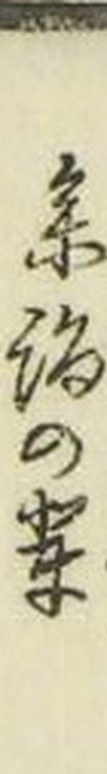参詣の軰
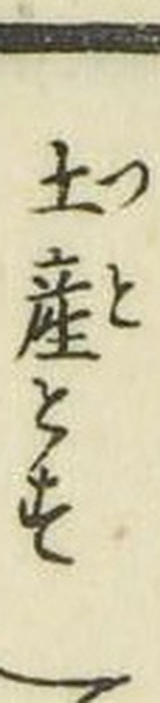土産とす

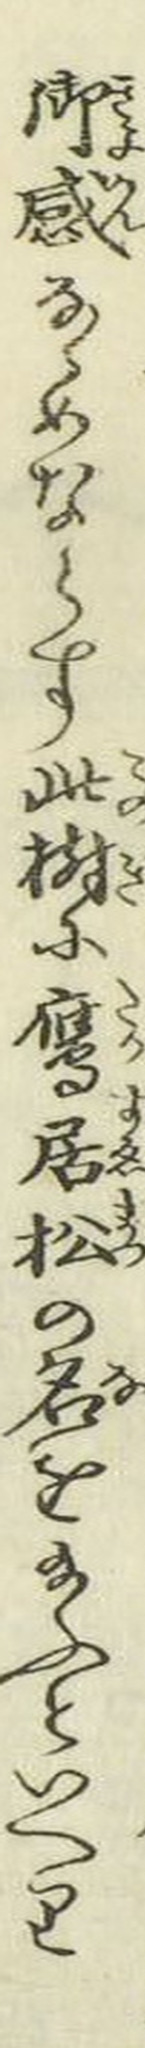御感なゝめならす此樹に鷹居松の名を給ふといへり
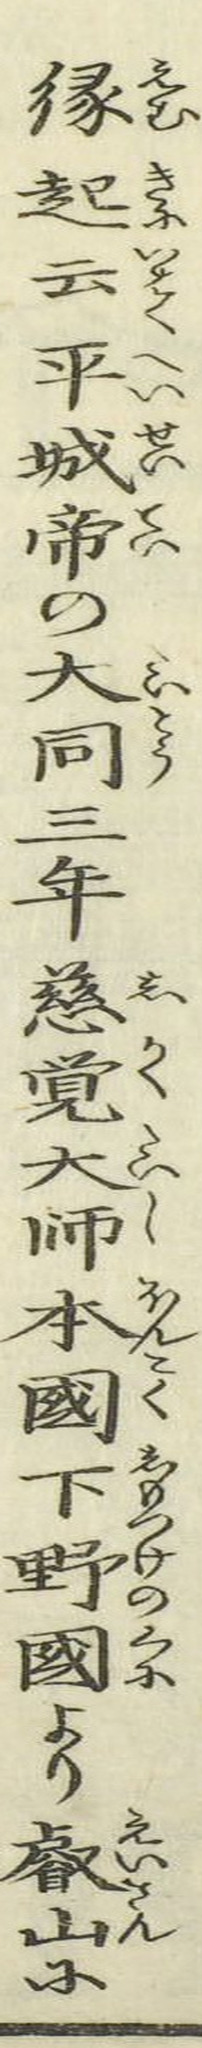縁起云平城帝の大同三年慈覚大師本國下野國より叡山に
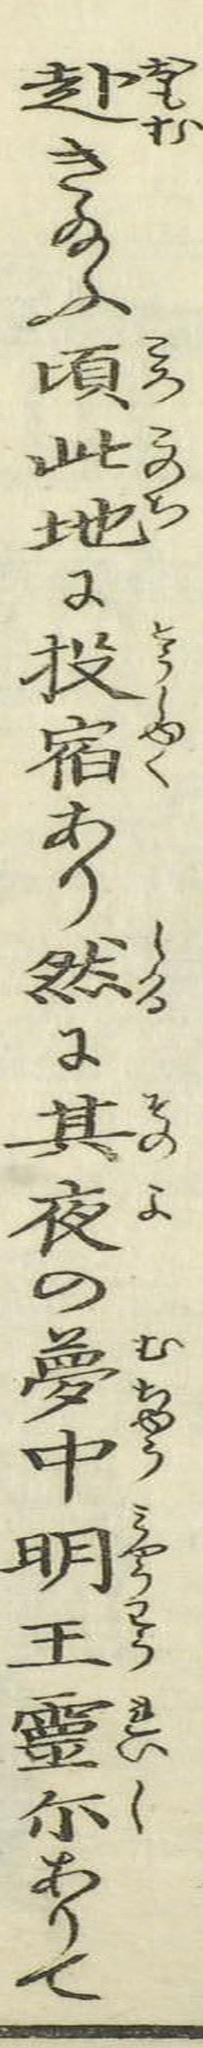赴き給ふ頃此地に投宿あり然に其夜の夢中明王靈尓ありて
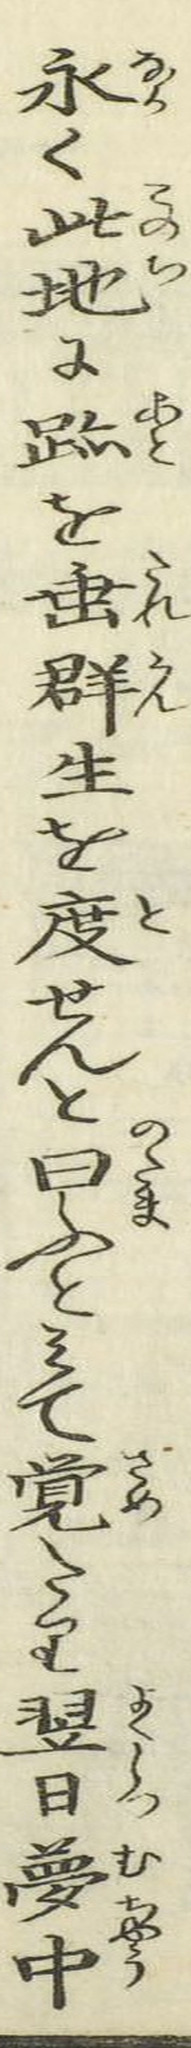永く此地に跡を垂群生を度せんと曰ふとみて覚たり翌日夢中
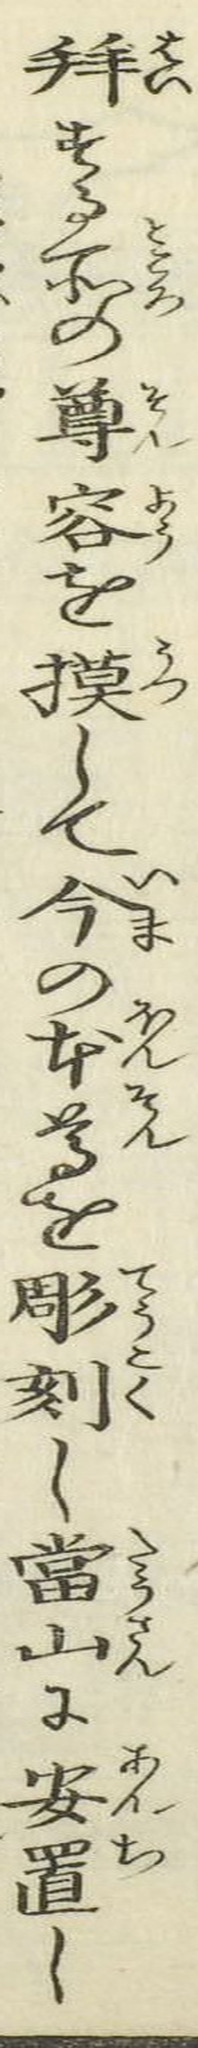拜する所の尊容を摸して今の本尊を彫刻し當山に安置し
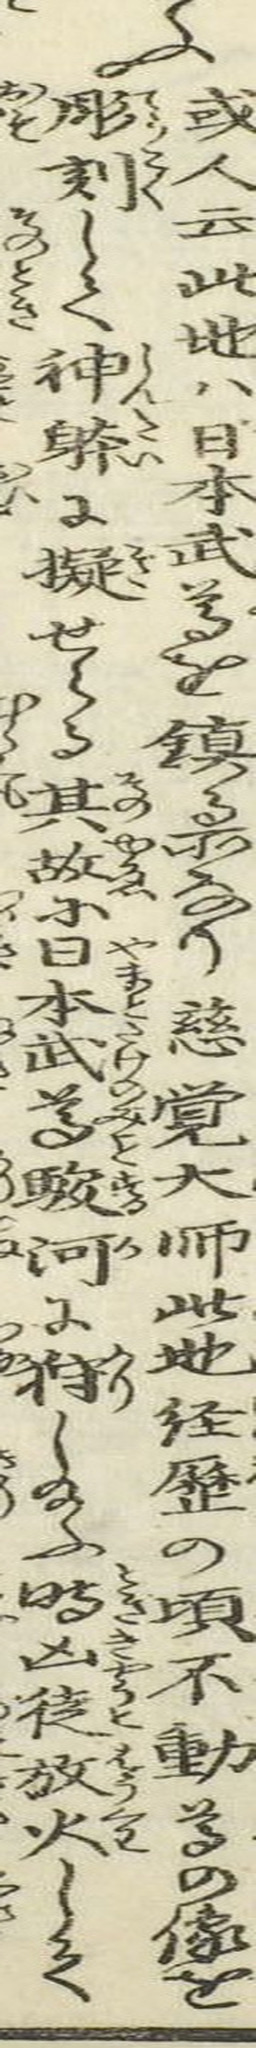彫刻して神躰に擬せらる其故に日本武尊駿河に狩し給ふ時凶徒放火して
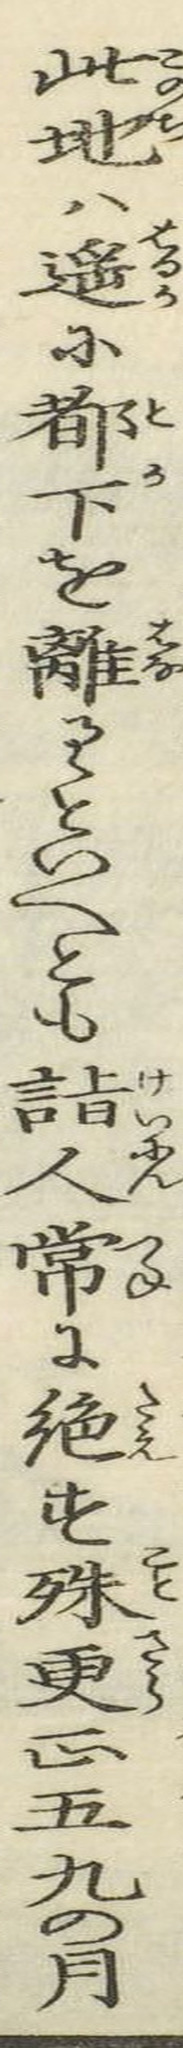此地は遥に都下を離るゝといへとも詣人常に絶す殊更正五九の尽月
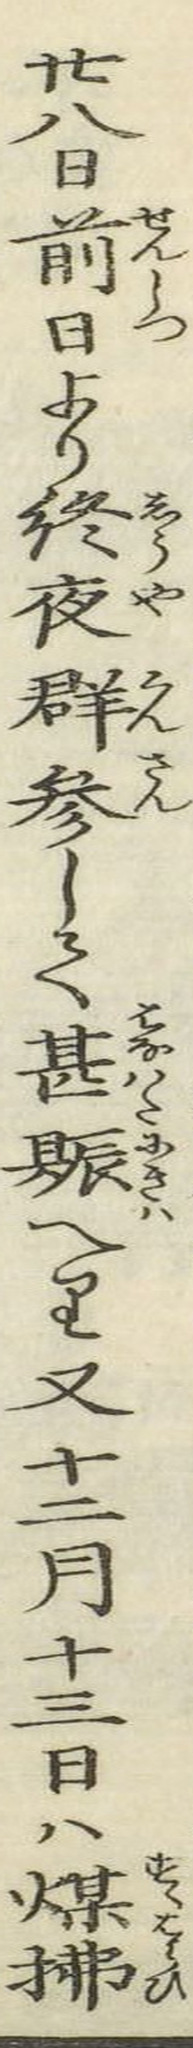廿八日前日より終夜群参して甚賑へり又十二月十三日は煤拂
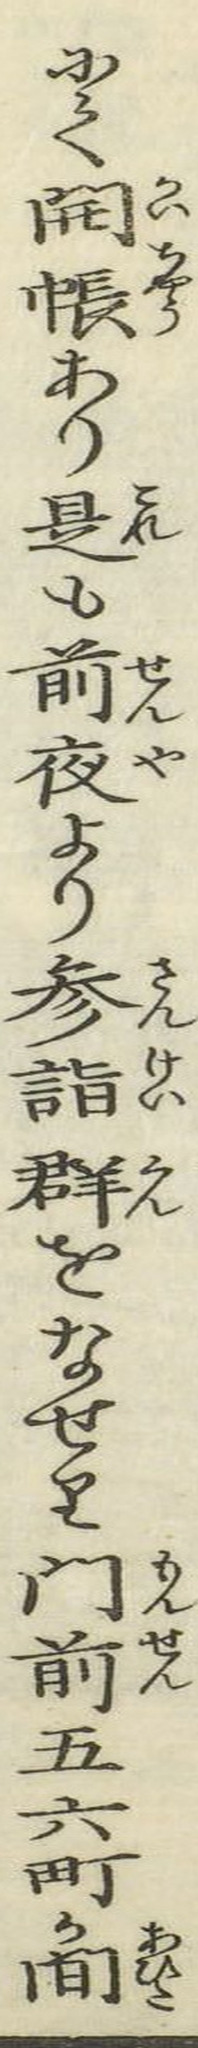にて開帳あり是も前夜より参詣群をなせり門前五六町か間
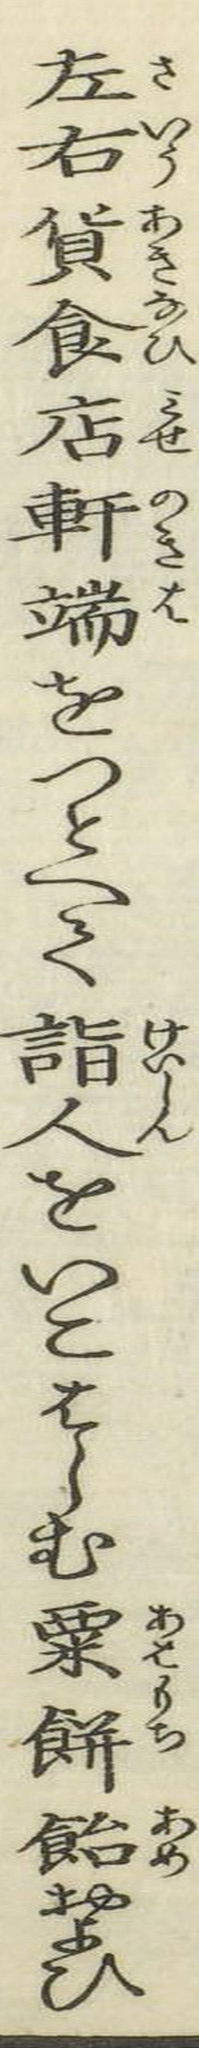左右貨食店軒端をつとへて詣人をいこはしむ粟餅飴およひ
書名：江戸名所図会 20巻 巻之7
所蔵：東京学芸大学教育コンテンツアーカイブ
